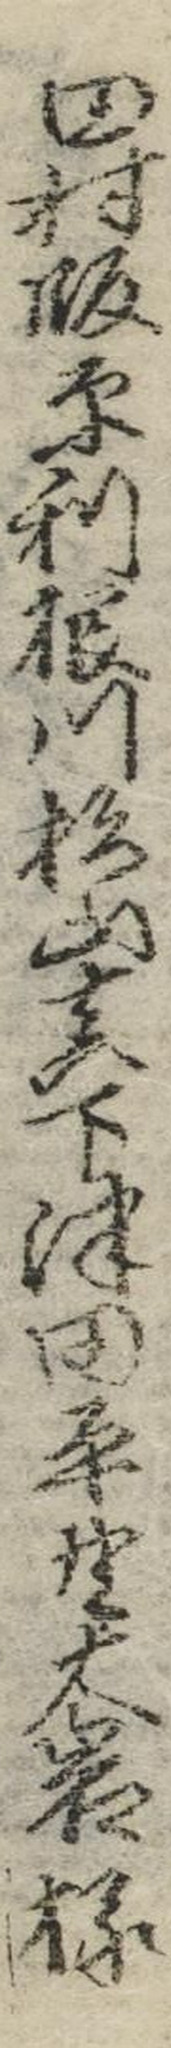田村飯原利根川松山真下津田平野大岩様
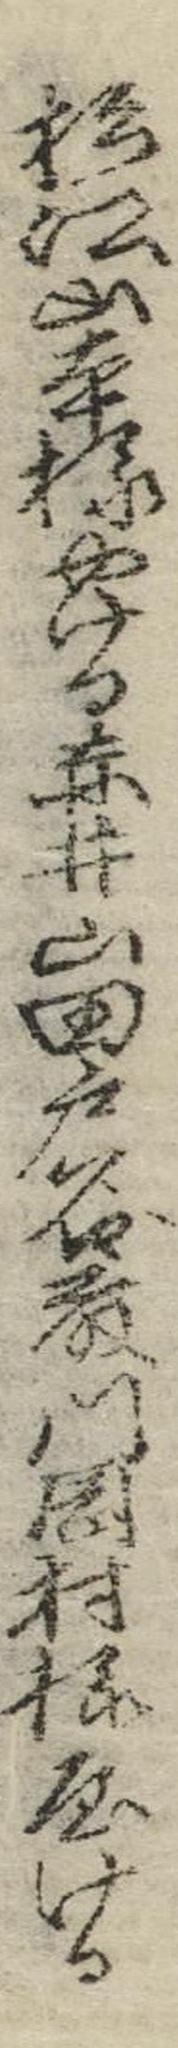松江山本様やける赤井山田戸谷藤川岡村様やける
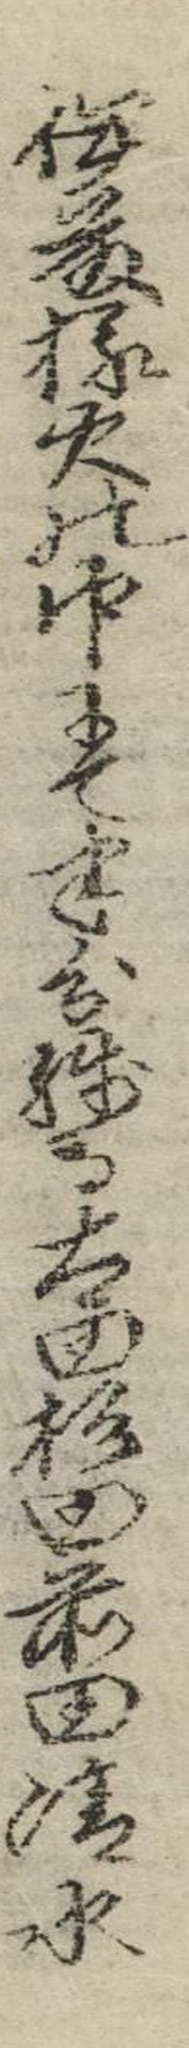伊藤様火の中にて半分残る太田杉田前田清水
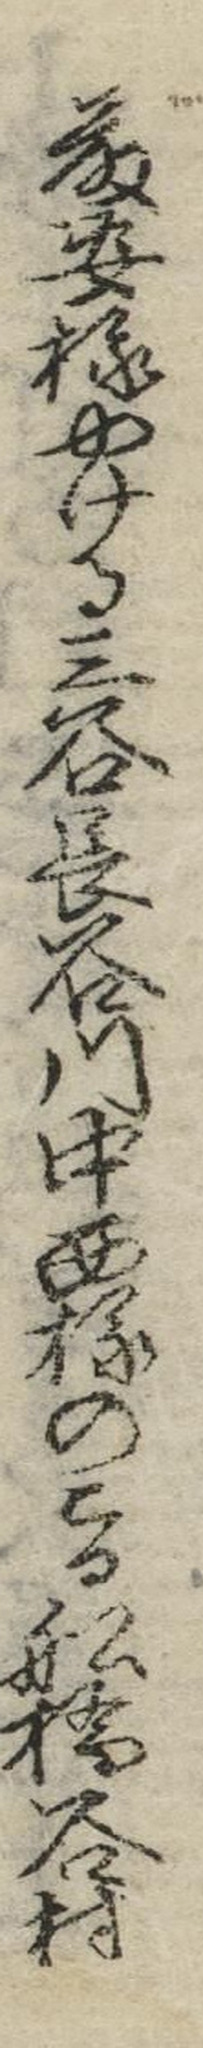藤安様やける三谷長谷川中西様のこる船橋谷村
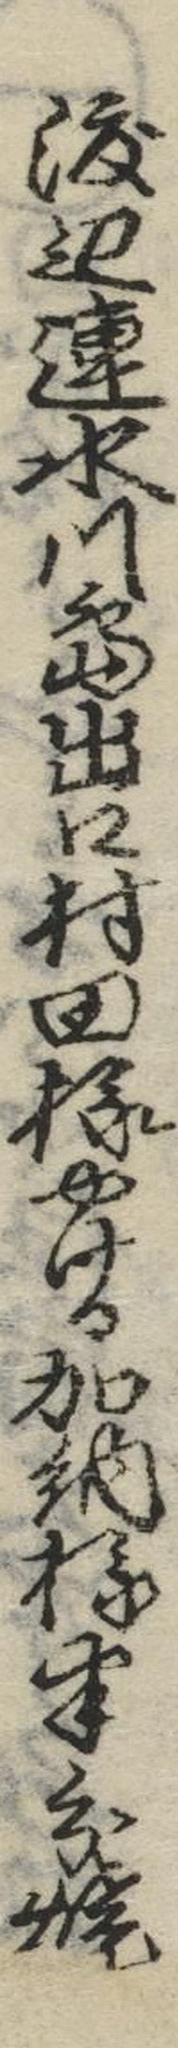渡辺連水川島出口村田様やける加納様半分焼
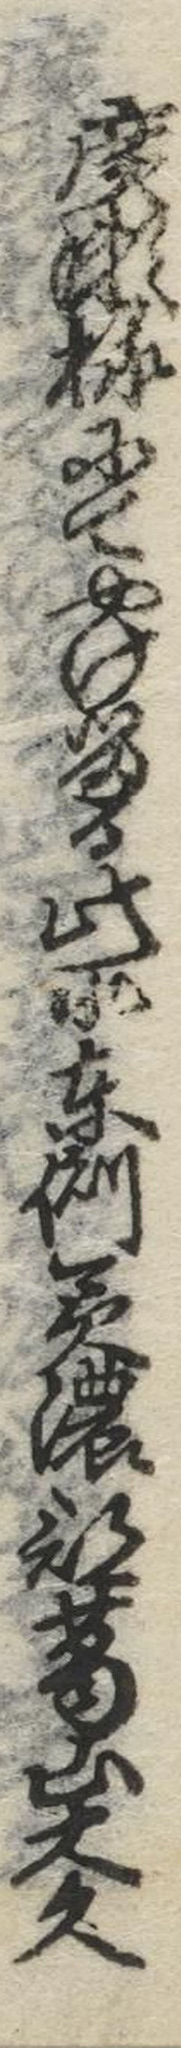廣瀬様にてやけ留る此所東側美濃部蕃山大久
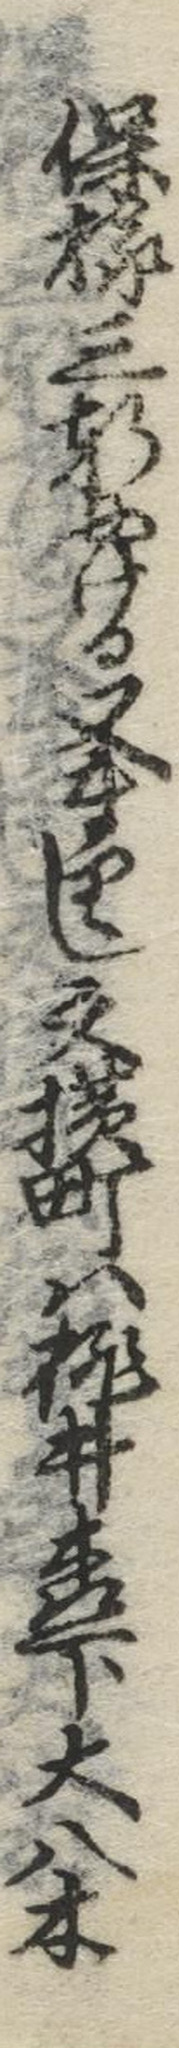保様三軒やける又まりし天横町ハ柳井森下大八木
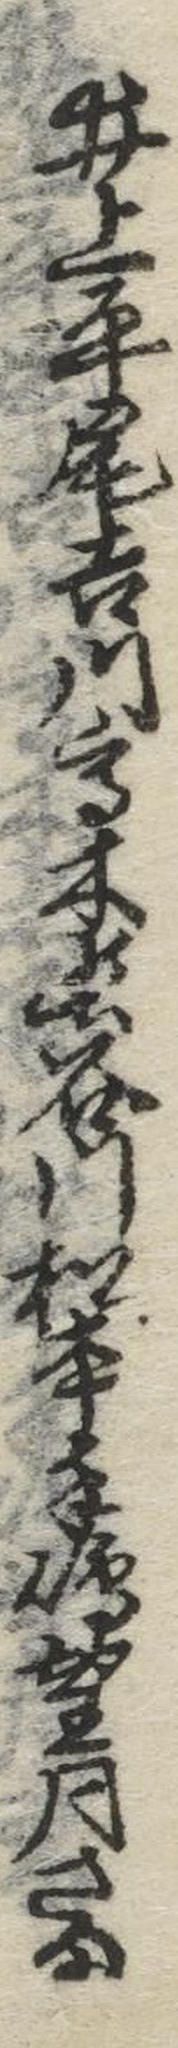井上平尾吉川高木長谷川松本手嶋望月さま
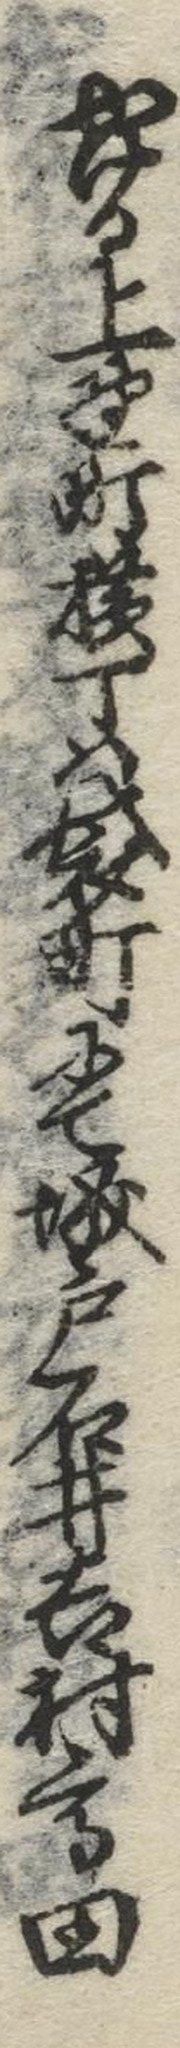やける上野町横丁ハ袋町にて城戸石井吉村高田
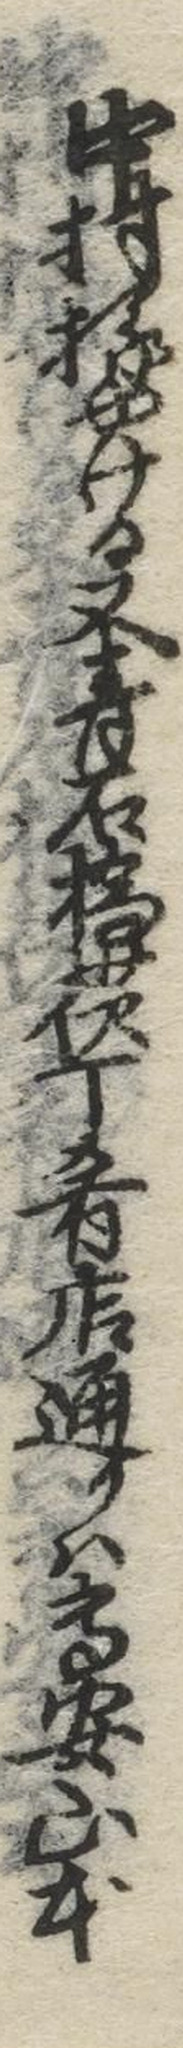中村様やける又青石橋横丁肴店通りハ高安山本
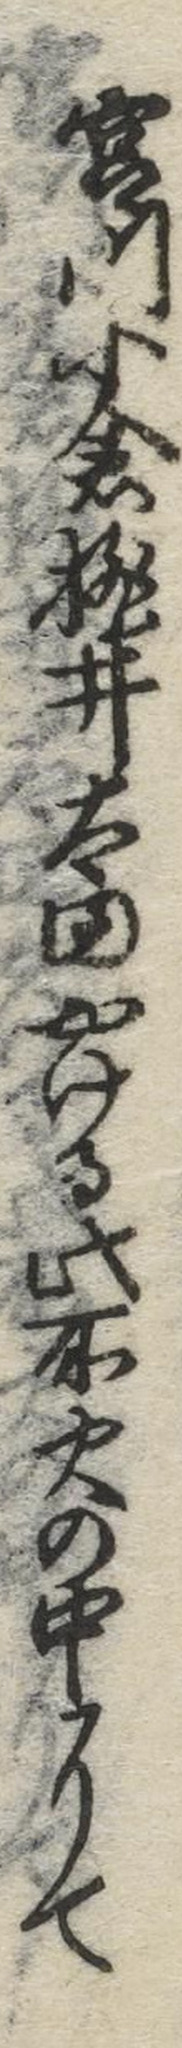宮川小倉柳井太田やける此所火の中にて
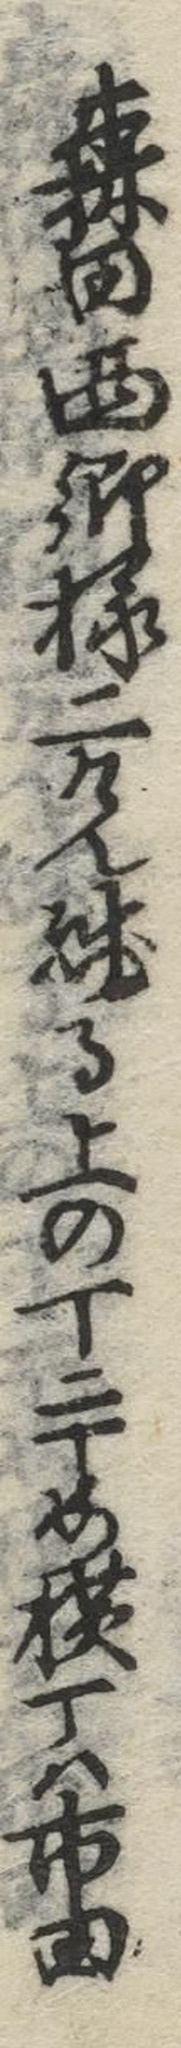森田西郷様二けん残る上の丁二丁め横丁ハ市田
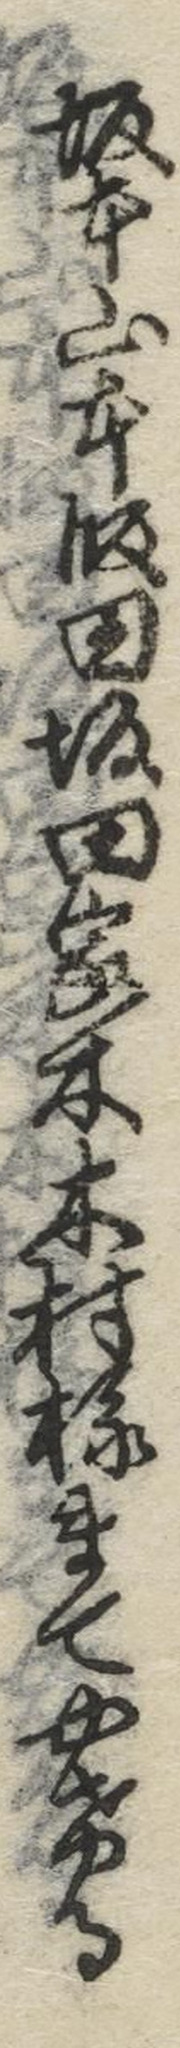坂本山本飯田坂田家木木村様まてやける
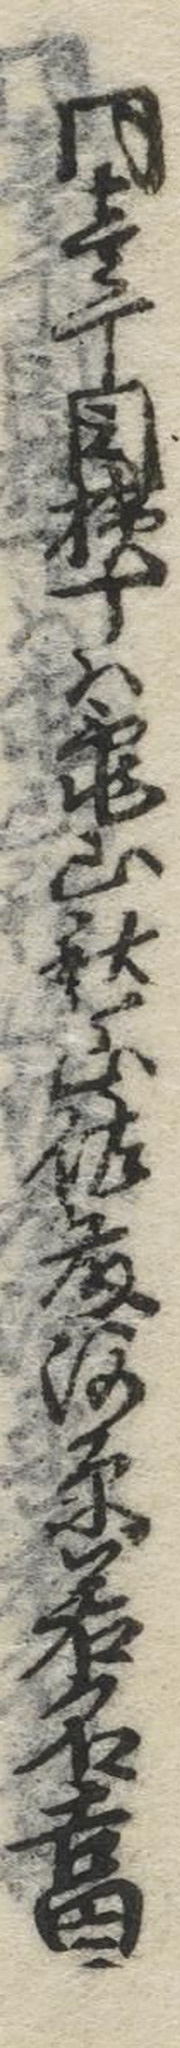同壱丁目横丁ハ亀山秋山佐藤河原若名吉田
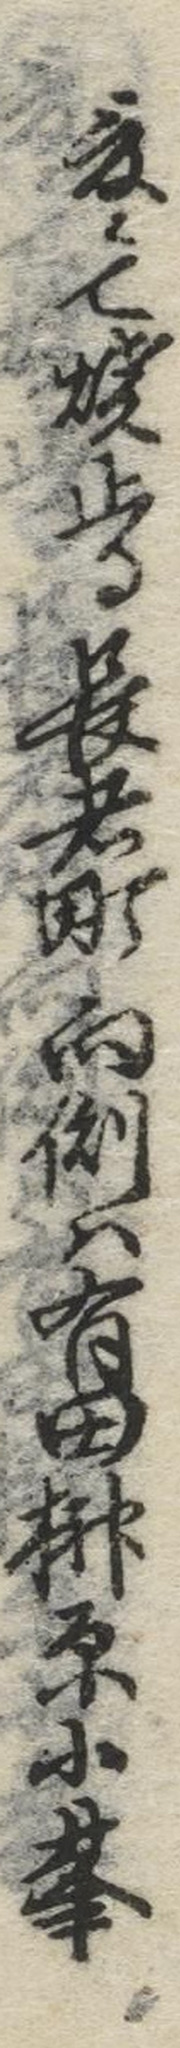爰ニて焼止る長老町向側ハ有田榊原小峯
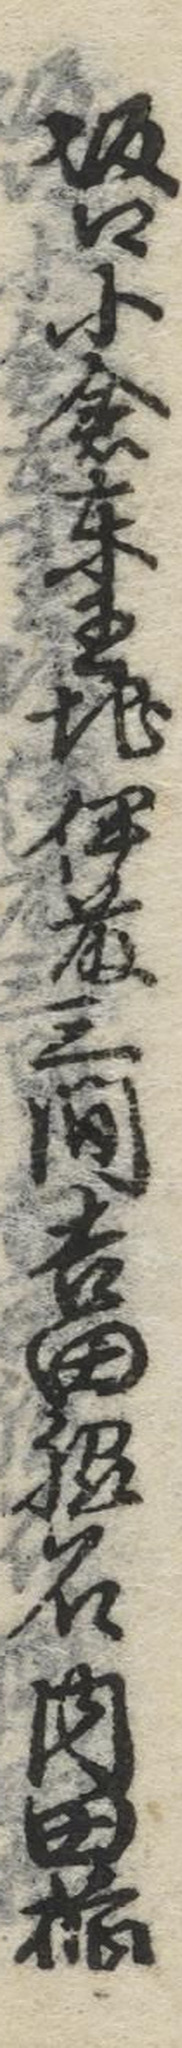坂口小倉東王地伊藤三間吉田脇名内田橋
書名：江戸御屋鋪方町方共　地震類焼場所巨細書之寫　潰家潰土蔵共取調附街道筋近在迄
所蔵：東京大学地震研究所図書室 Earthquake Research Institute Library, The University of Tokyo, JAPAN
